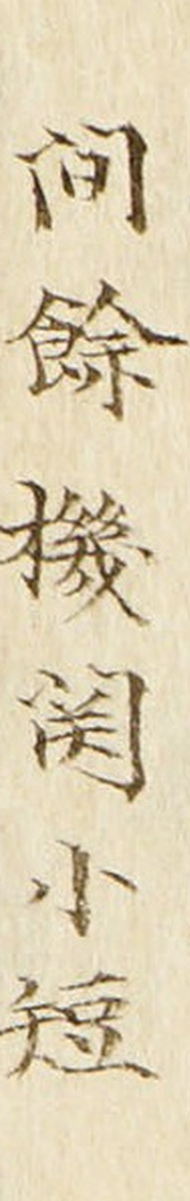間余機関小短板障

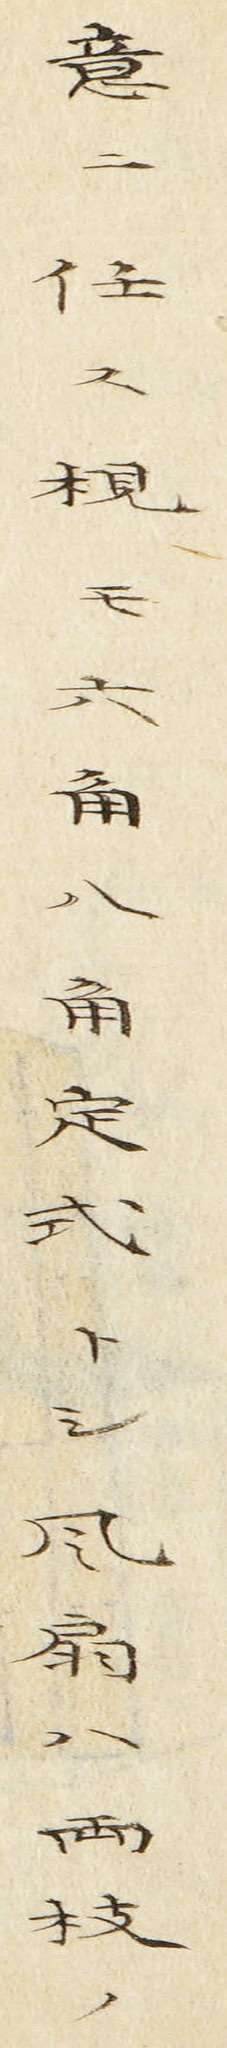意ニ任ス梘モ六角八角定式トシ風扇ハ両枝ノ
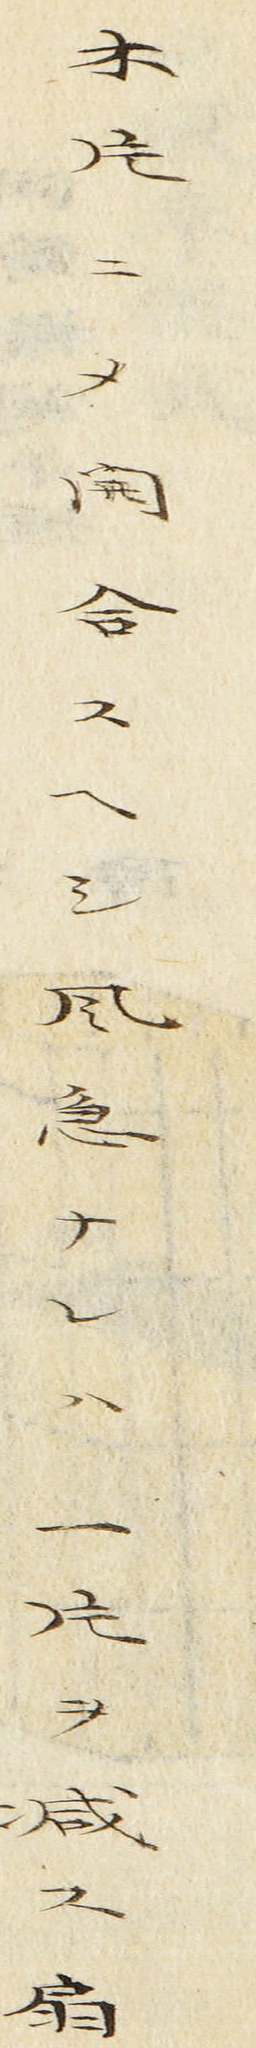木片ニシテ開合スヘシ風急ナレハ一片ヲ減ス扇
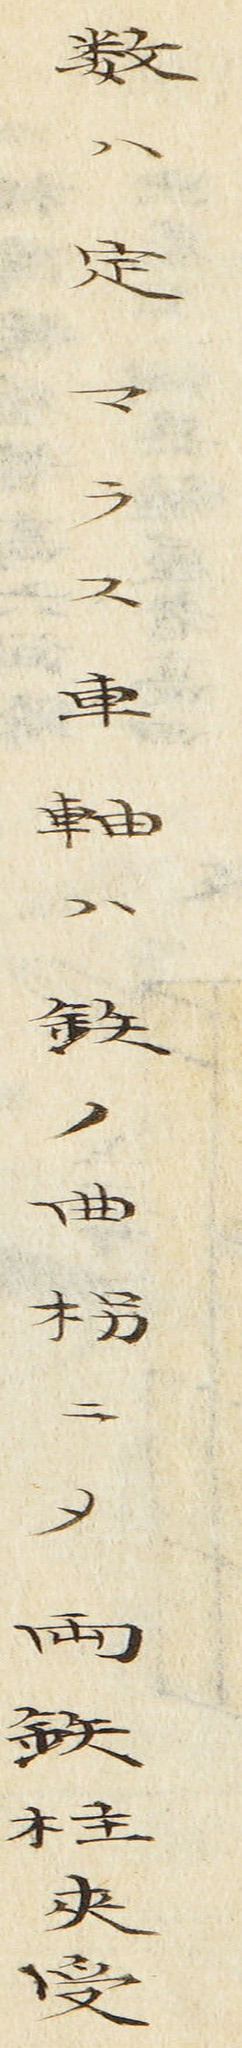数ハ定マラス車軸ハ鉄ノ曲枴ニシテ両鉄柱夾受
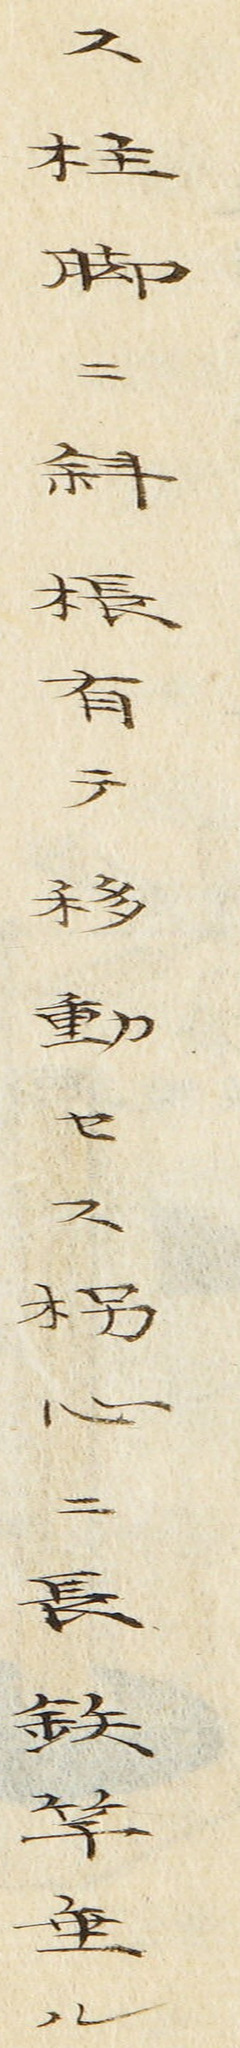ス柱脚ニ斜棖有テ移動セス枴心ニ長鉄竿垂ル
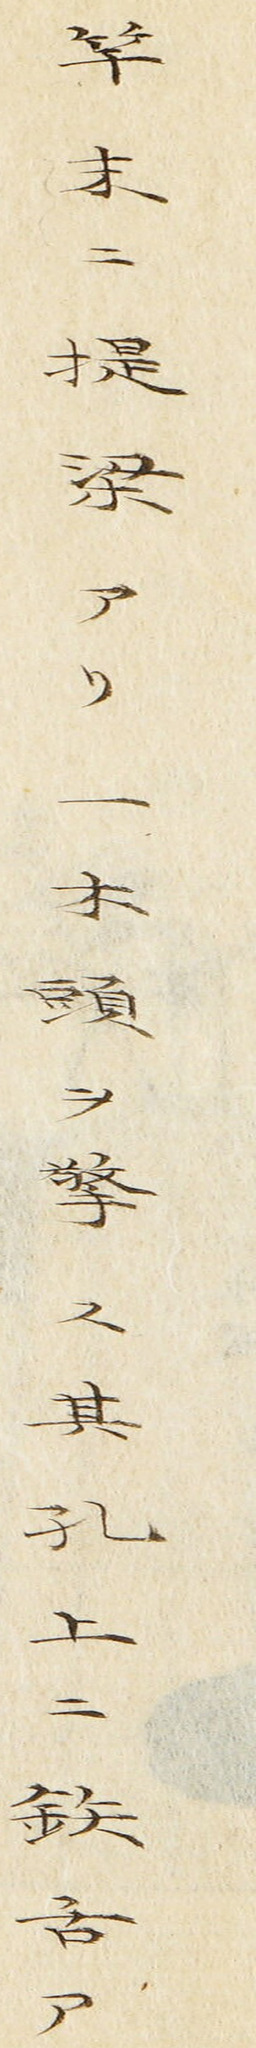竿末ニ提梁アリ一木頭ヲ擎ス其孔上ニ鉄舌ア
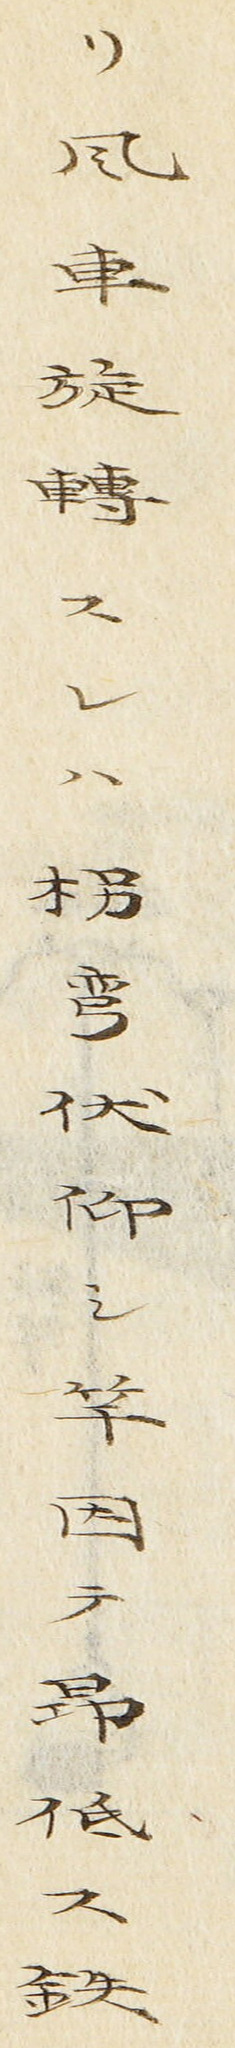リ風車旋転スレハ枴弯伏仰シ竿因テ昂低ス鉄
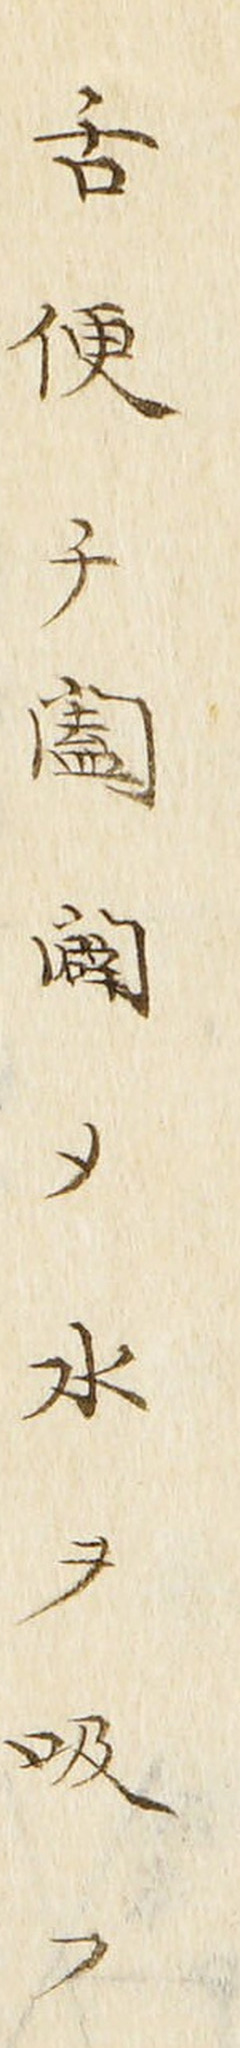舌便チ闔闢シテ水ヲ吸フ
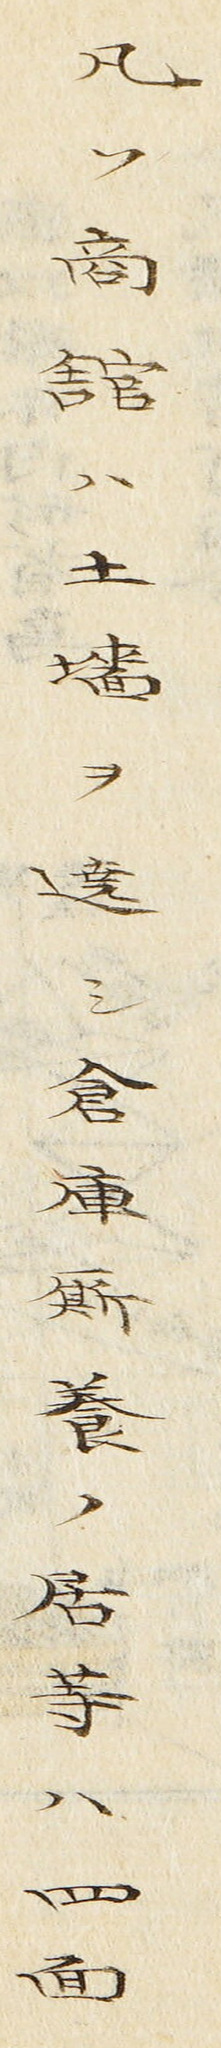〇凡ソ商館ハ土墻ヲ遶シ倉庫厮養ノ居等ハ四面
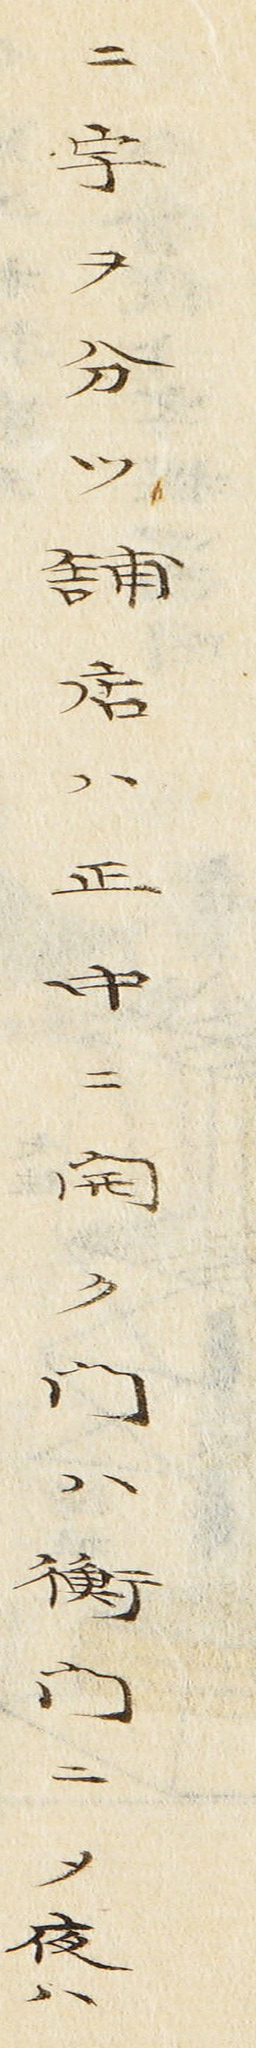ニ宇ヲ分ツ舗店ハ正中ニ開ク門ハ衡門ニシテ夜ハ
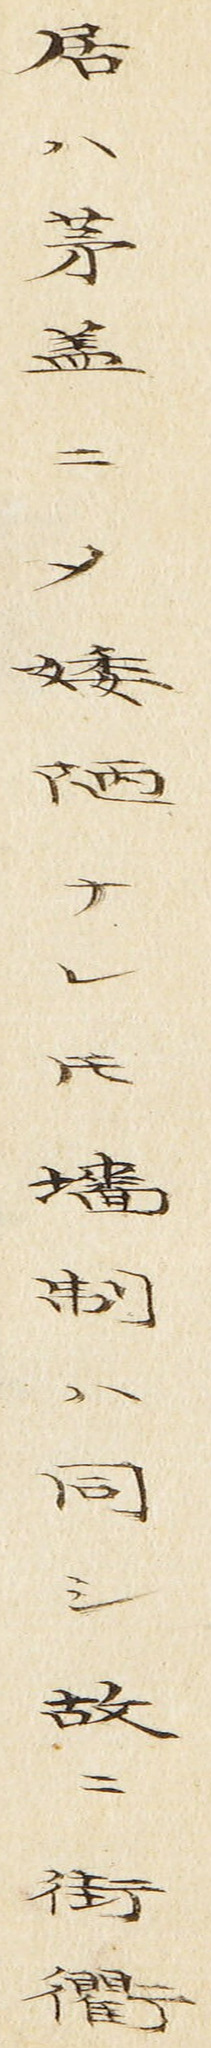居ハ茅盖ニシテ婑陋ナレトモ墻制ハ同シ故ニ街衢
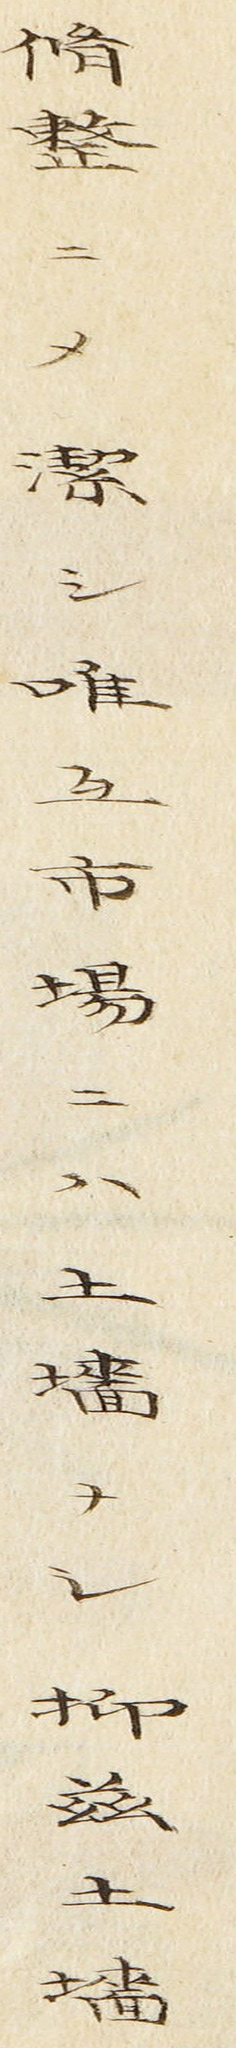修整ニシテ潔シ唯互市場ニハ土墻ナシ抑茲土墻
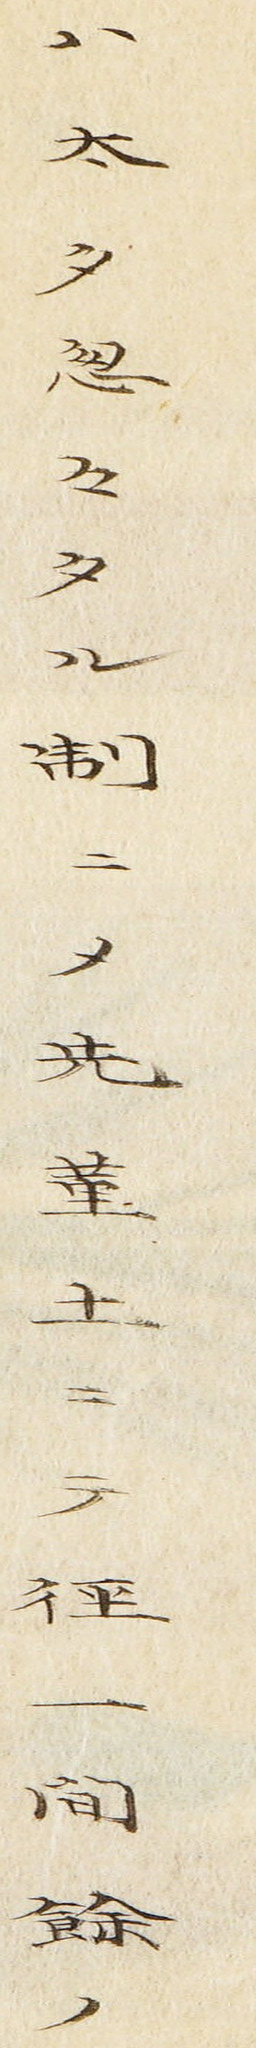ハ太夕忽々タル制ニシテ先菫？土ニテ径一間余ノ
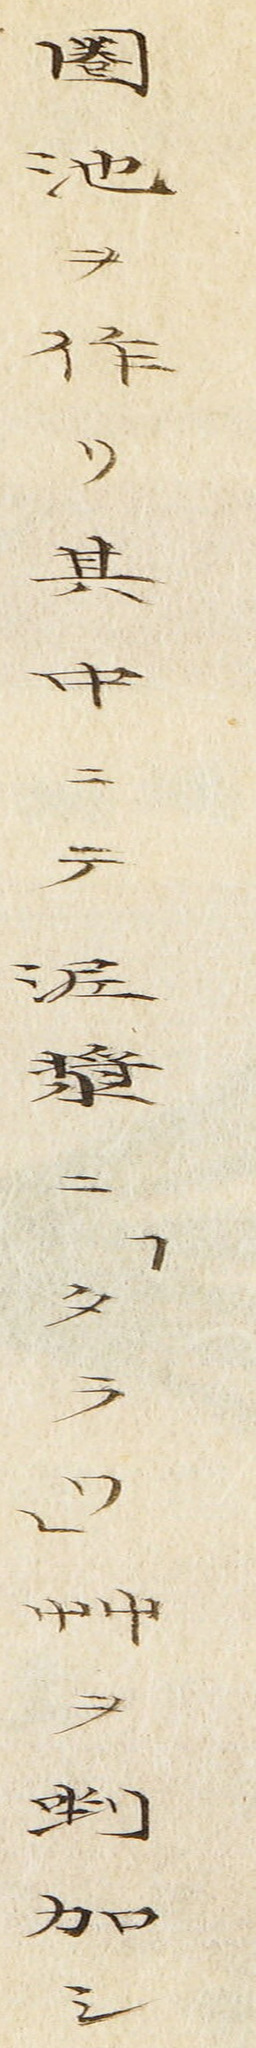圏池ヲ作リ其中ニテ泥漿ニ「タラワ」艸ヲ剉加シ
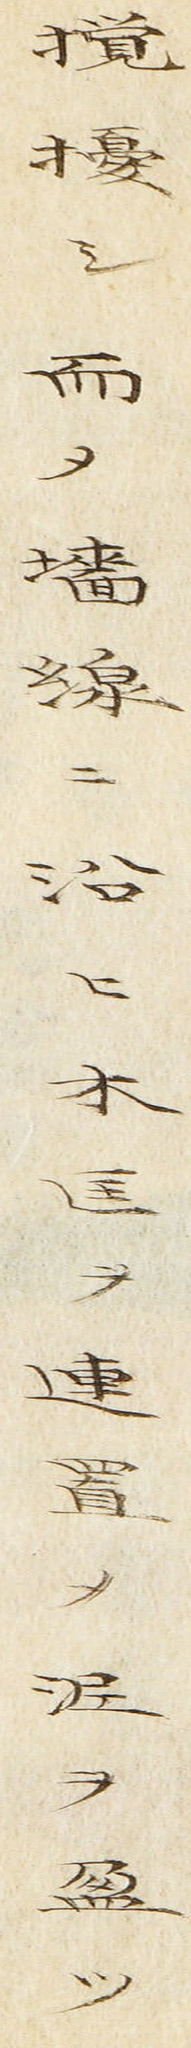攪擾シ而シテ墻線ニ沿ヒ木匡ヲ連置シテ泥ヲ盈ツ
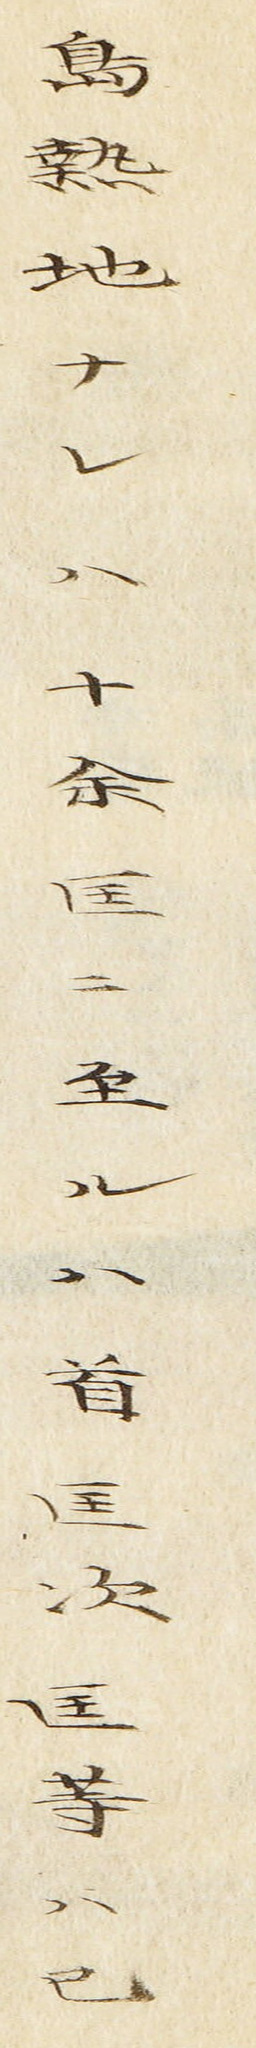島熱地ナレハ十余匡ニ至ルハ首匡次匡等ハ已
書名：蕃談
